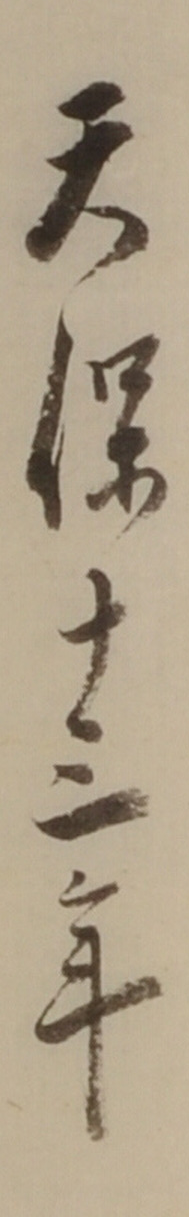天保十三年
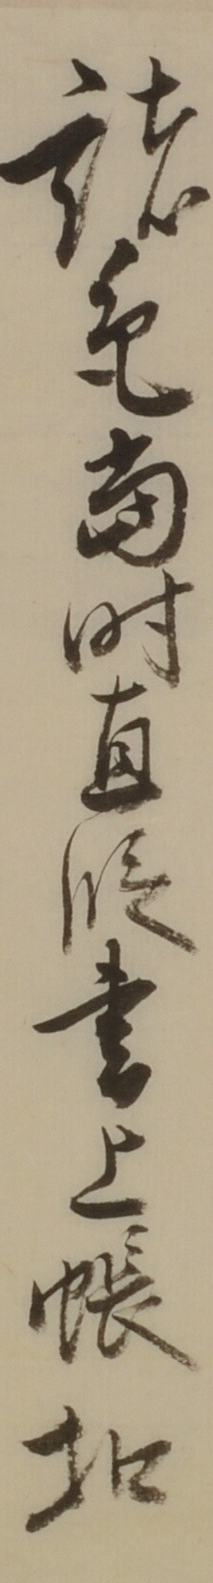諸色當時直段書上帳扣

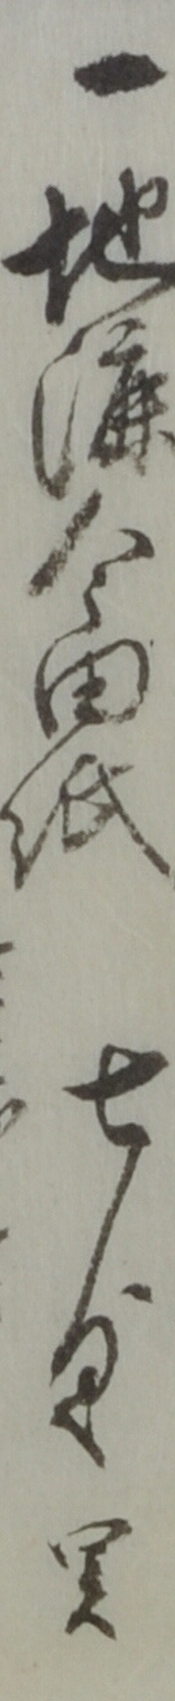一地漉今田紙七匁買
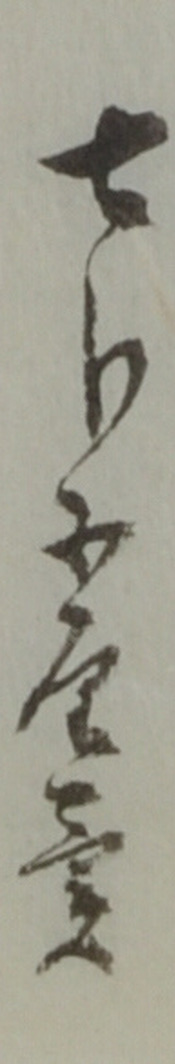七分五厘売
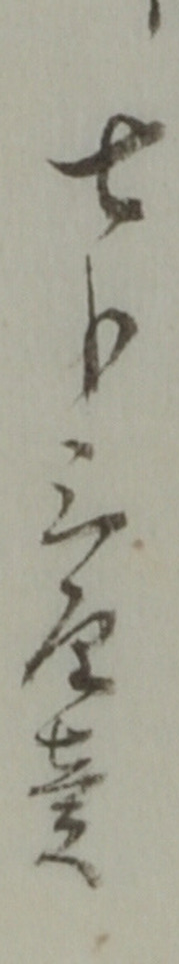七分三厘売
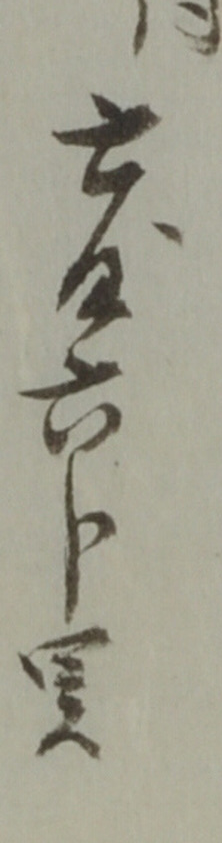弐匁四分買
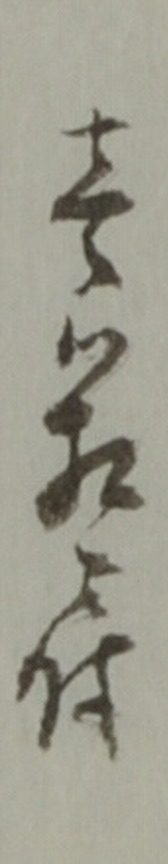壱箱ニ付
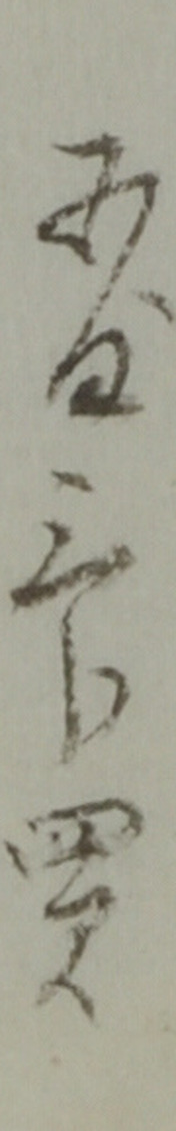弐匁四分買
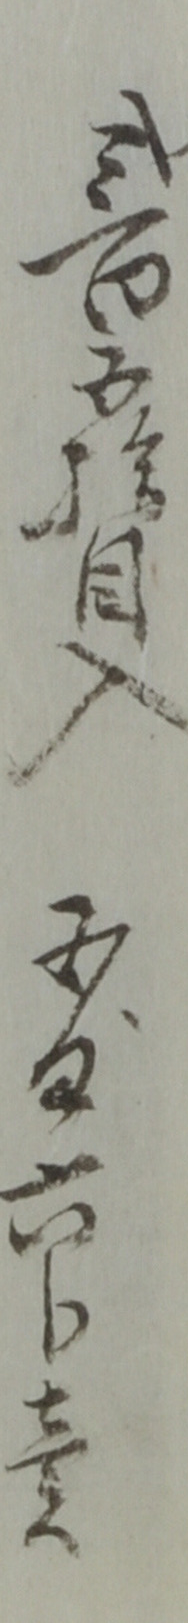弐百五拾目入五匁六分売
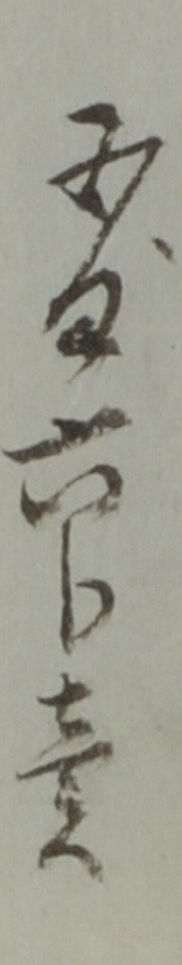弐匁六分売
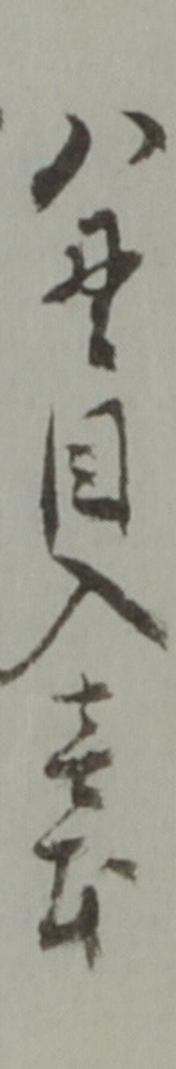八貫目入壱本
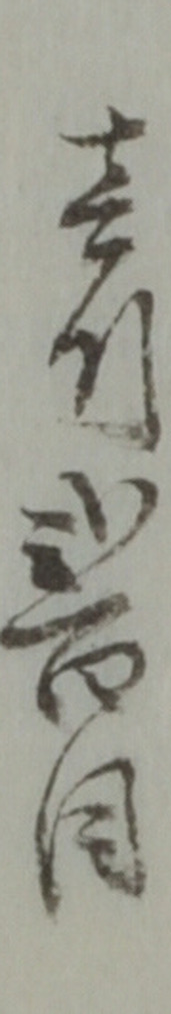壱斤弐百目
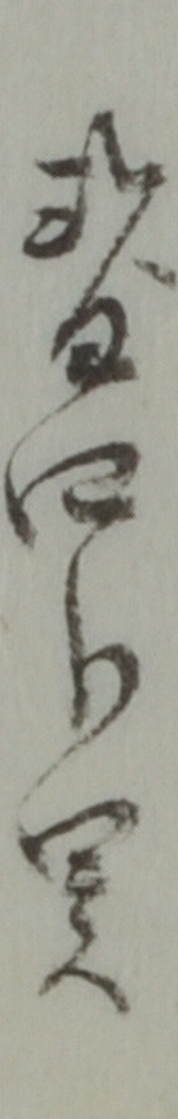弐匁四分買
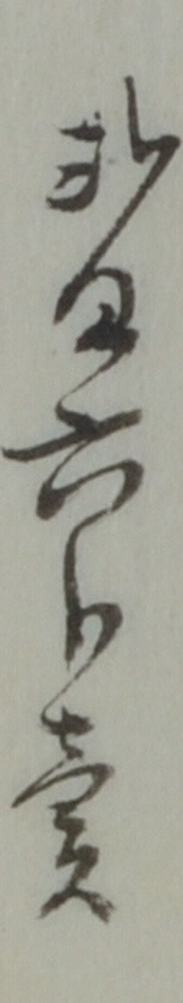弐匁六分売

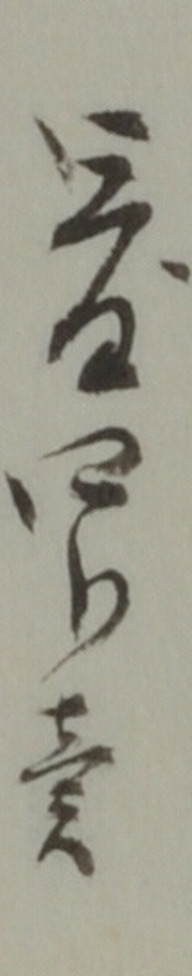三匁四分売
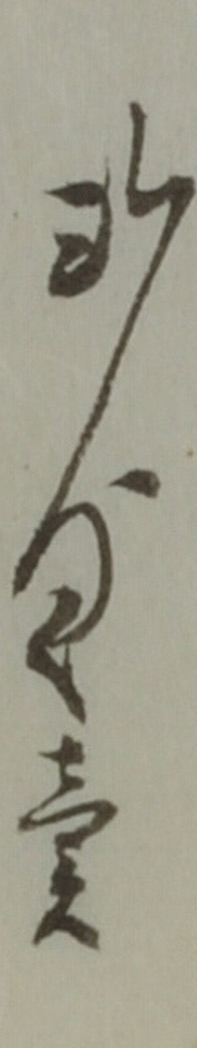弐匁売
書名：諸色當時直段書上帳扣
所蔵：伊那市立高遠町図書館・合同会社AMANE
